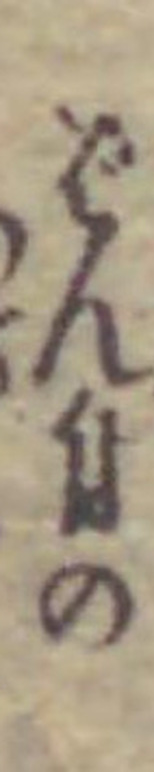ばん付の
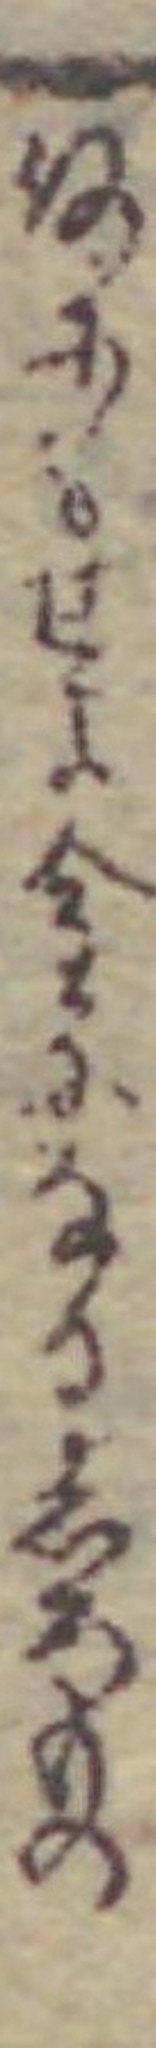何にもせよ金になるしろもの
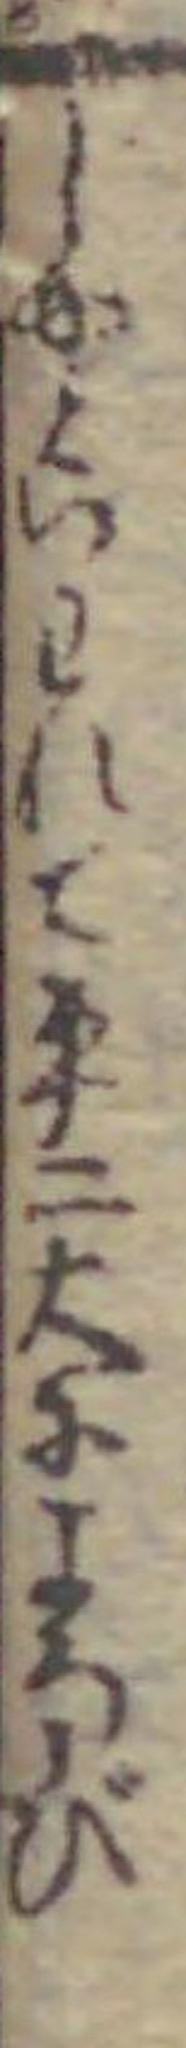しやといわれて平二大によろこび
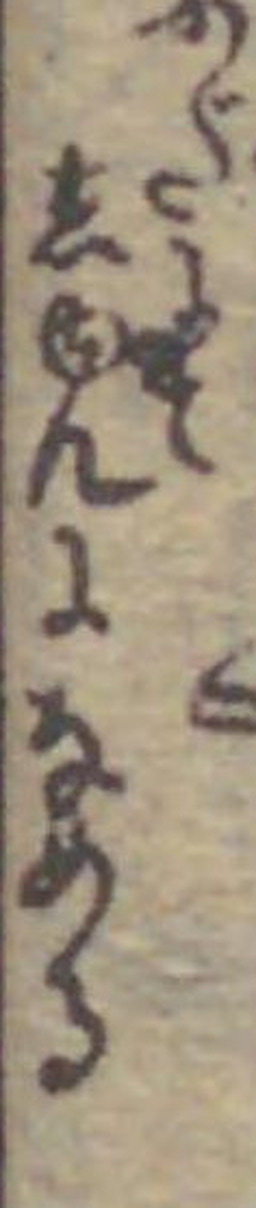しゆんになめる
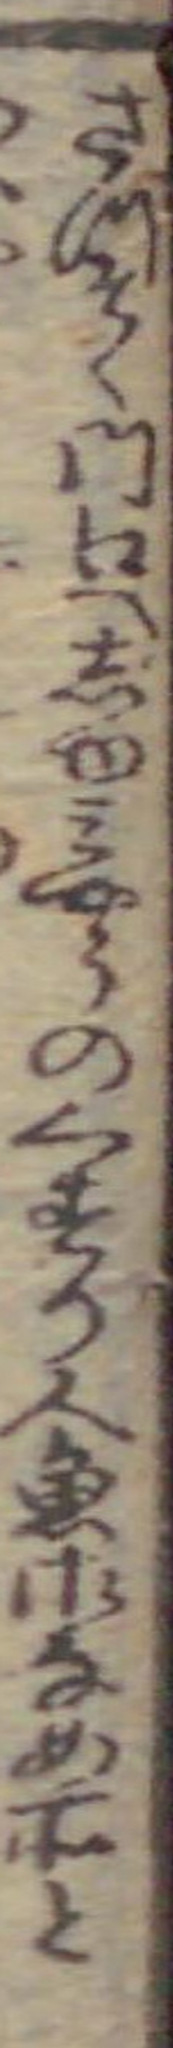さつそく門口へじゆみやうのくすり人魚御なめ所と
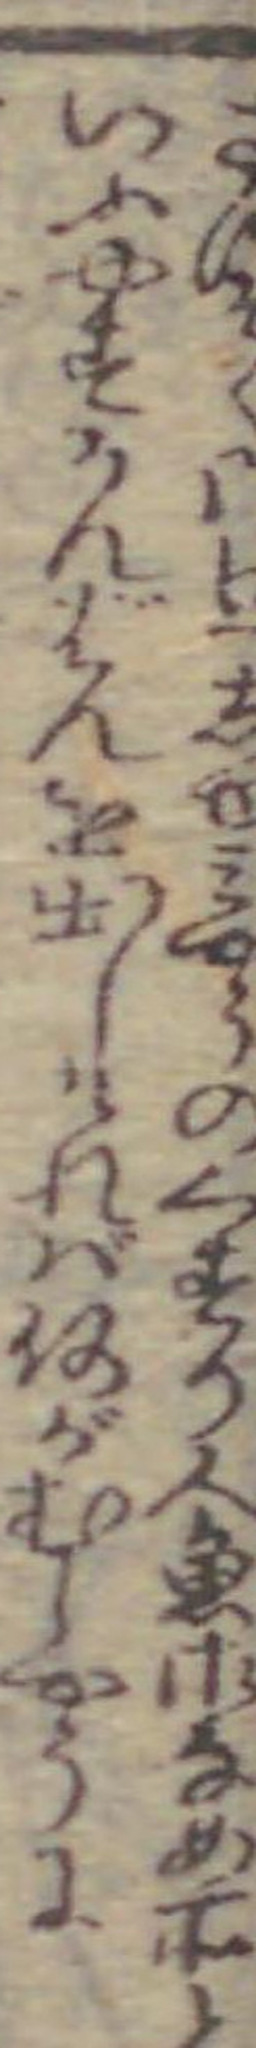いふやすかんばんを出しければ何がむしやうに
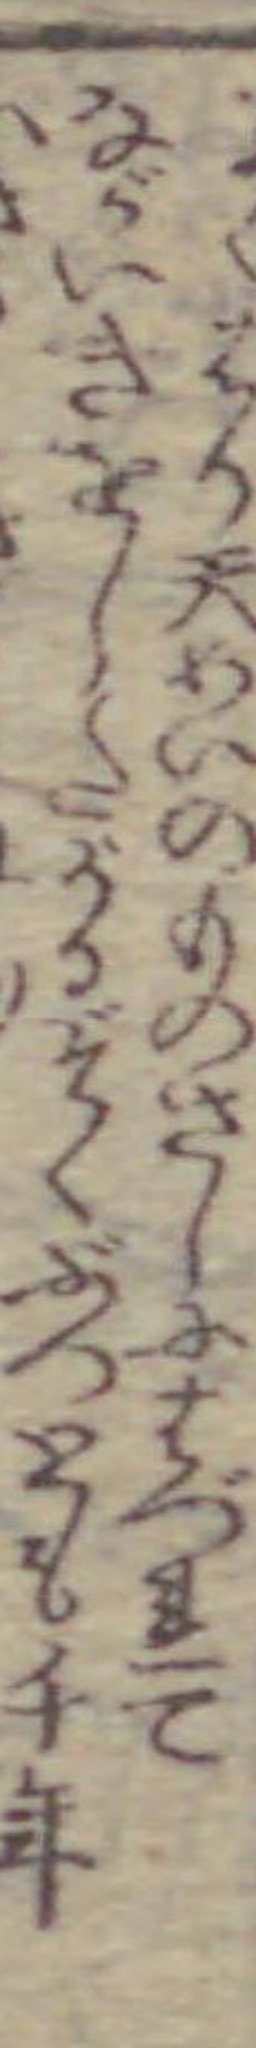ながいきをしたがるぞくぶつとも千年
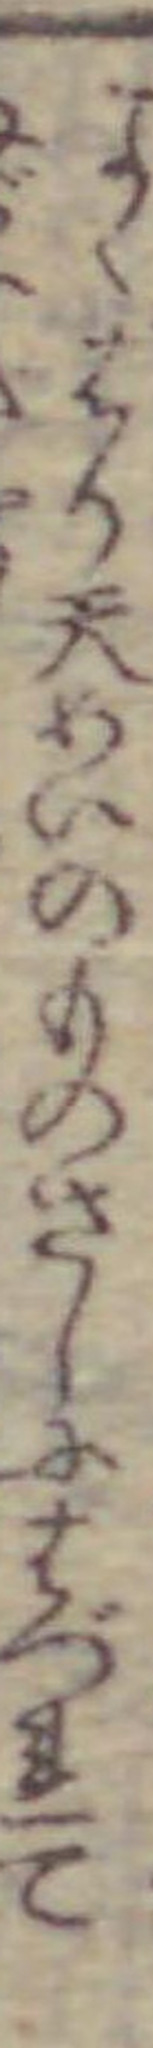よくばり天明のものさしにはづれて
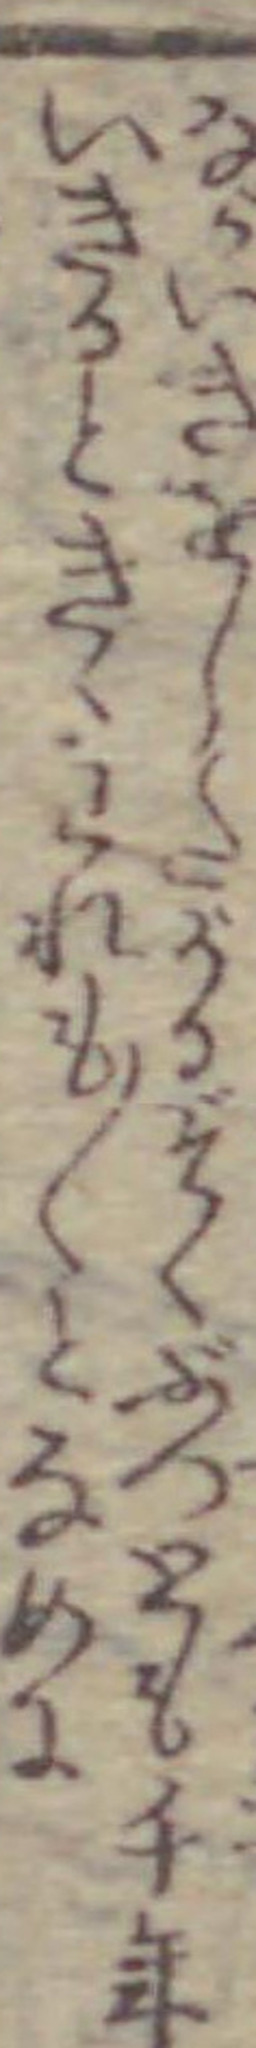いきるときゝわれも〳〵となめに
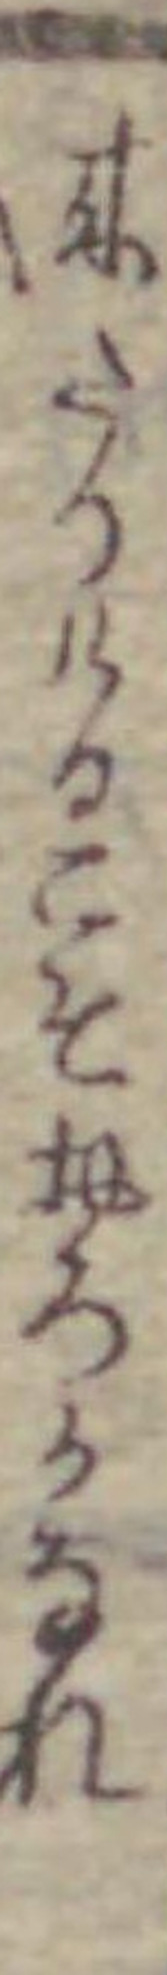来たりけるこそおろかなれ
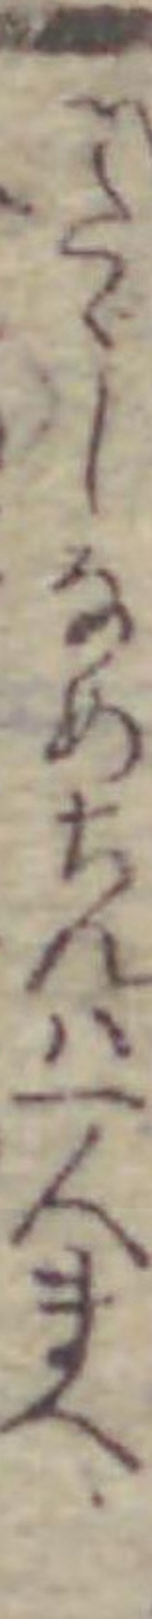〽たゞしなめちんは一人まへ
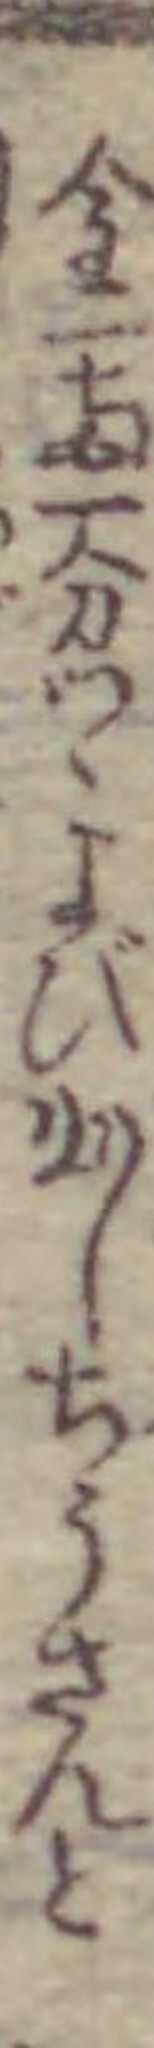金一両一分つゝよび出しちうさんと
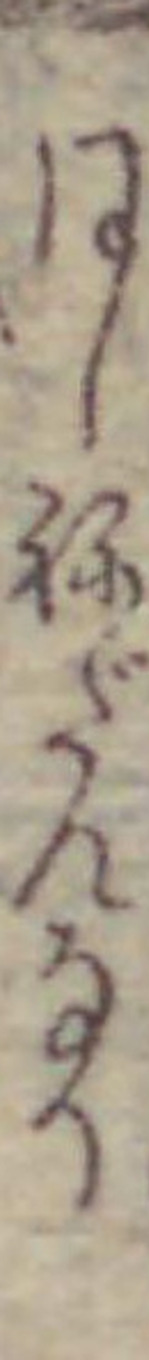同しねだんなり
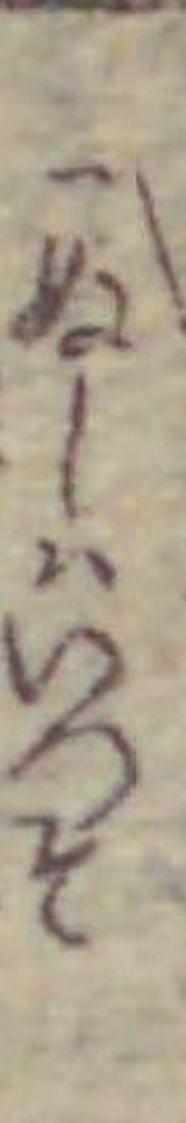〽ぬしはいつそ
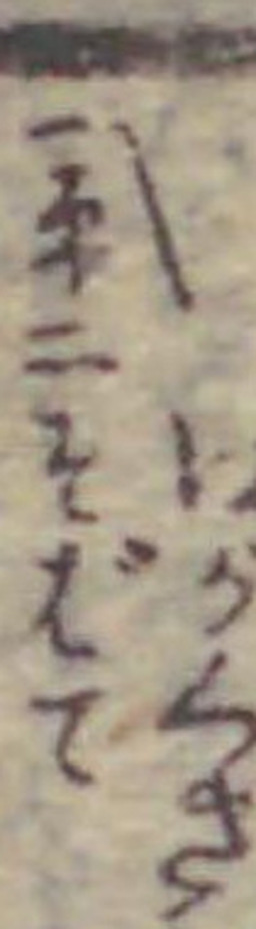〽平二そばて
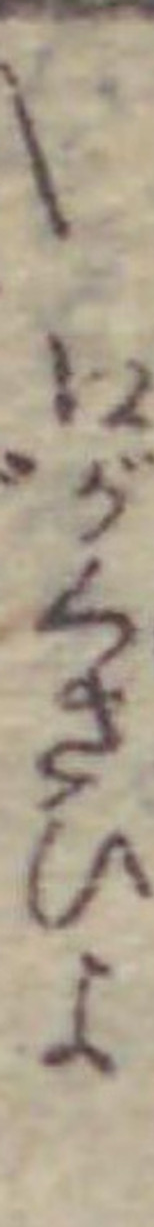口がくさいひよ
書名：箱入娘面屋人魚 3巻
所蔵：国立国会図書館 National Diet Library, JAPAN
